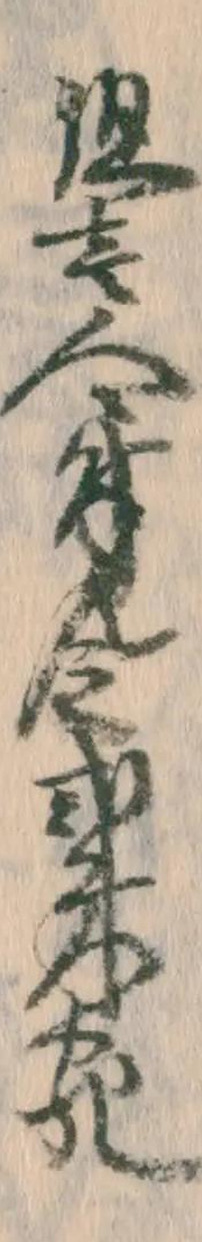但壱人ニ付金弐朱宛
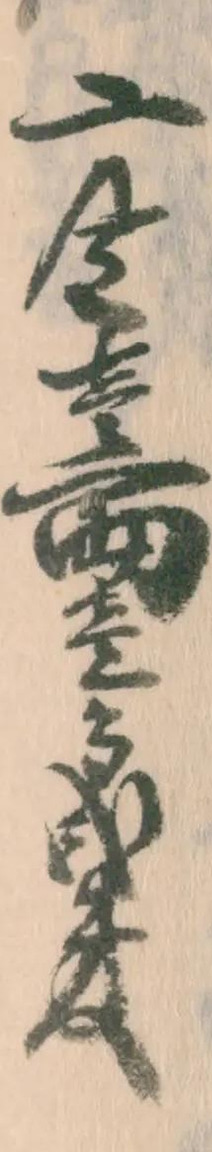〆金壱両壱分弐朱
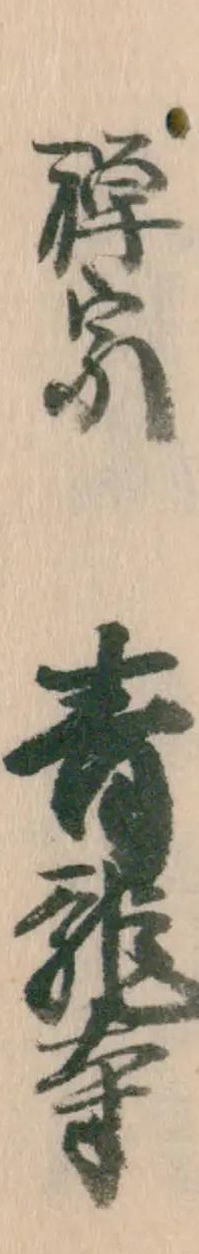禅宗青龍寺
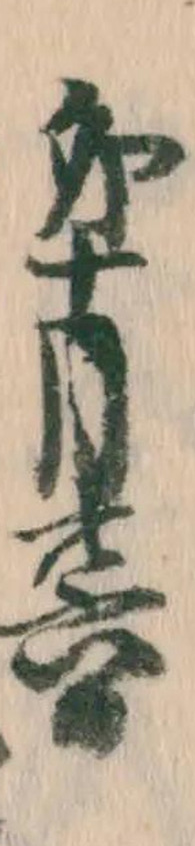卯十月廿六日
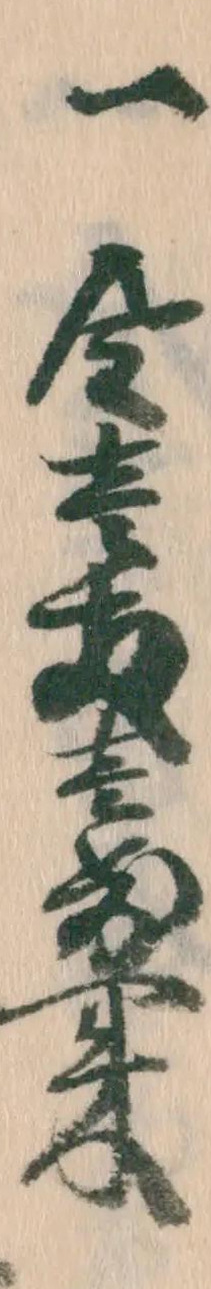〆金壱両壱分弐朱
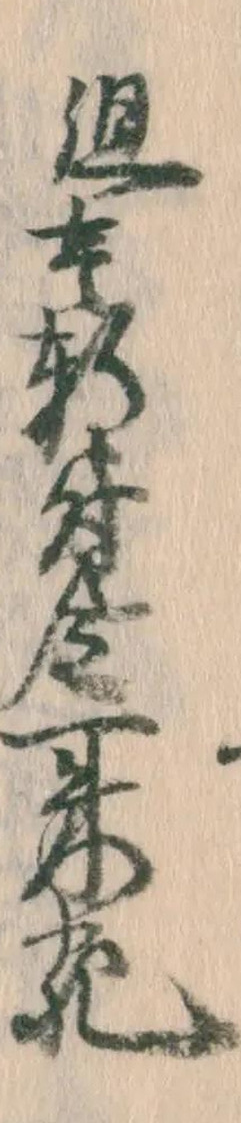但壱人ニ付金弐朱宛
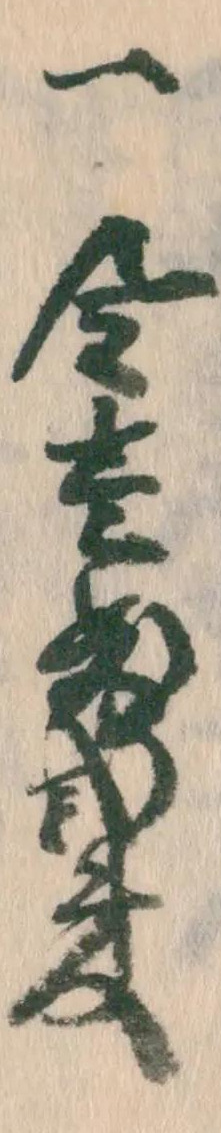一金壱歩弐朱右町
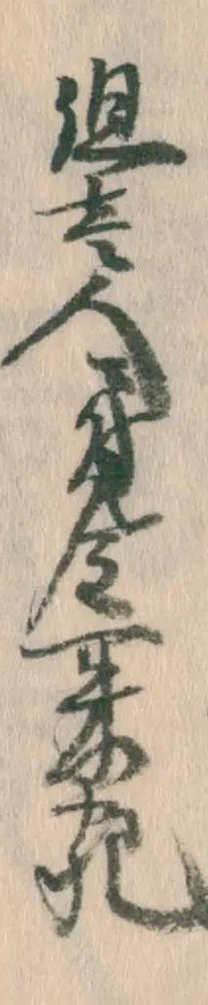但壱人ニ付金弐朱宛

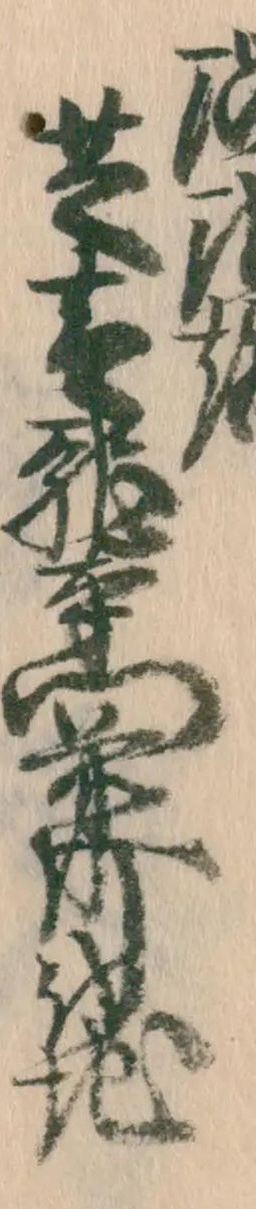同芝青龍寺門前町代地
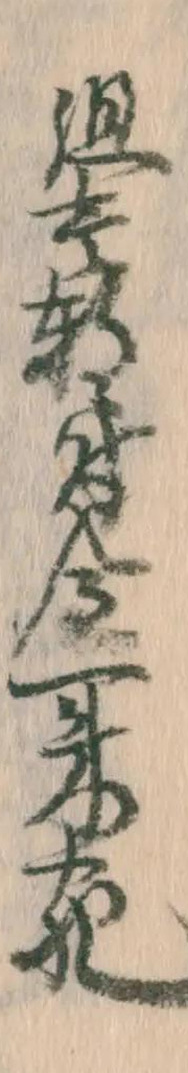但壱軒ニ付金一朱宛
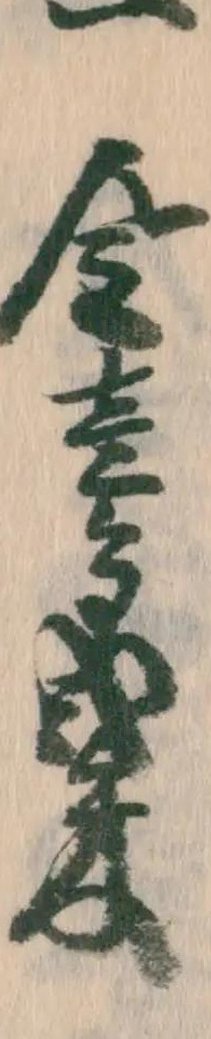一金三分弐朱
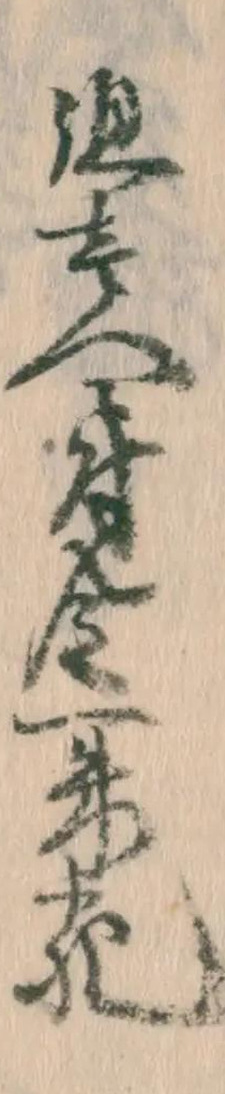但壱人ニ付金一朱宛
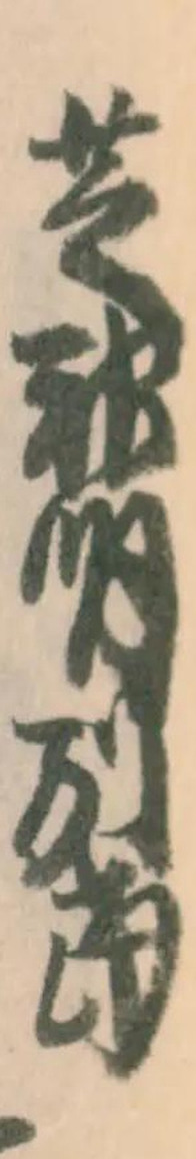芝神明別当
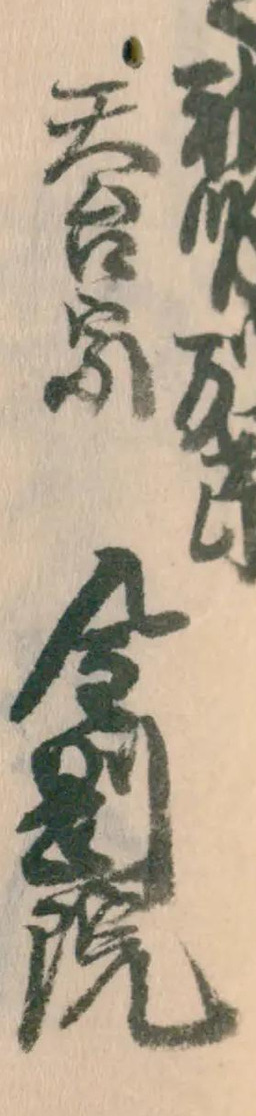天台宗金剛院
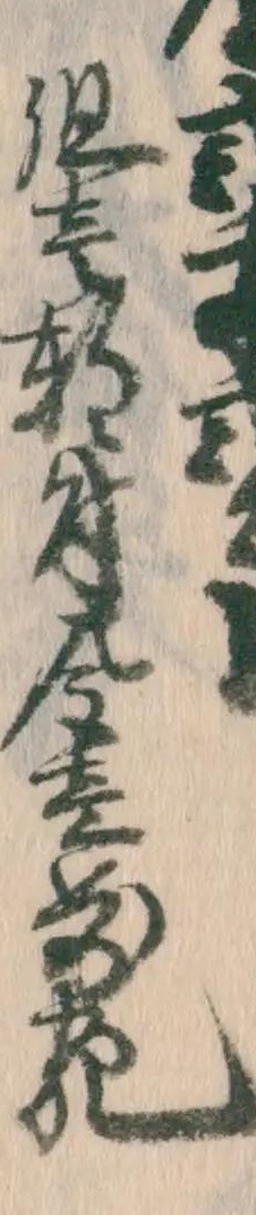但壱軒ニ付金一朱宛
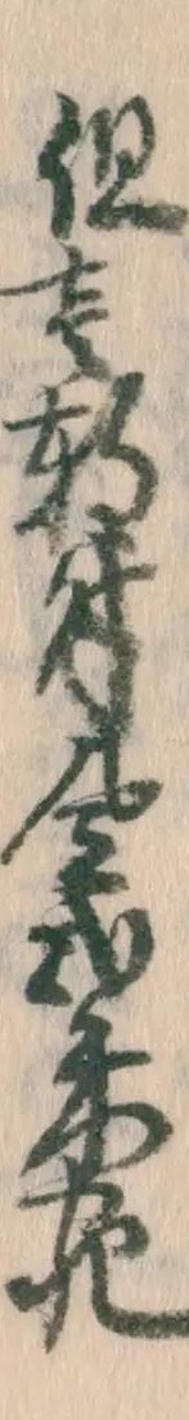但壱軒ニ付金弐朱宛
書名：武家方并寺院等ニテ施差出候一件
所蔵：国立国会図書館 National Diet Library, JAPAN
